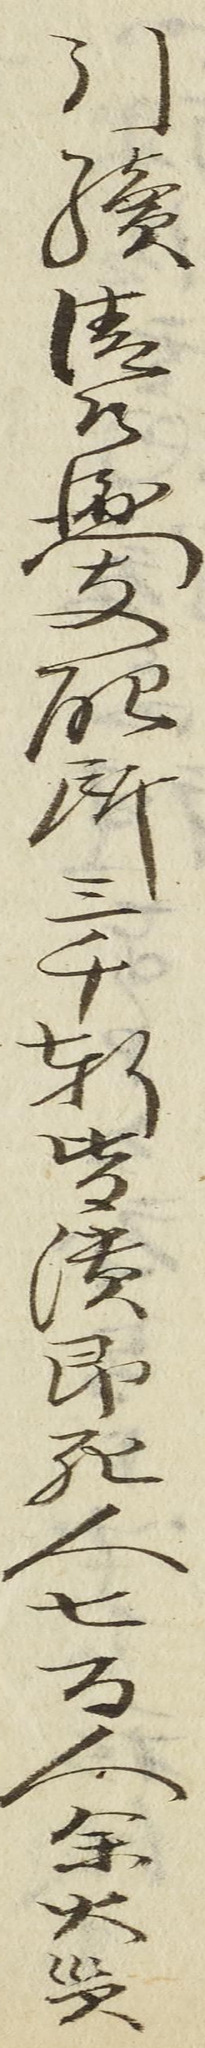引続清左衛門支配所三千軒皆潰即死人七百人余大災
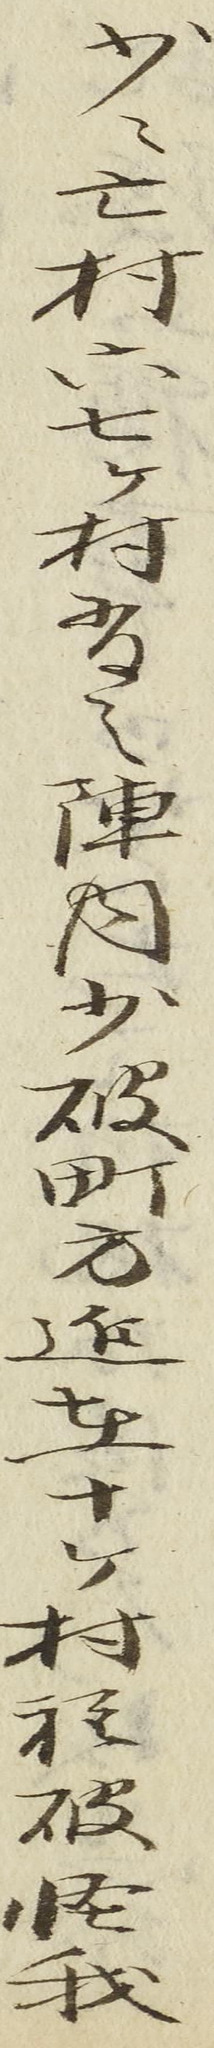少々亡村六七ヶ村有之陣内少破損町方近在十ヶ村程破怪我
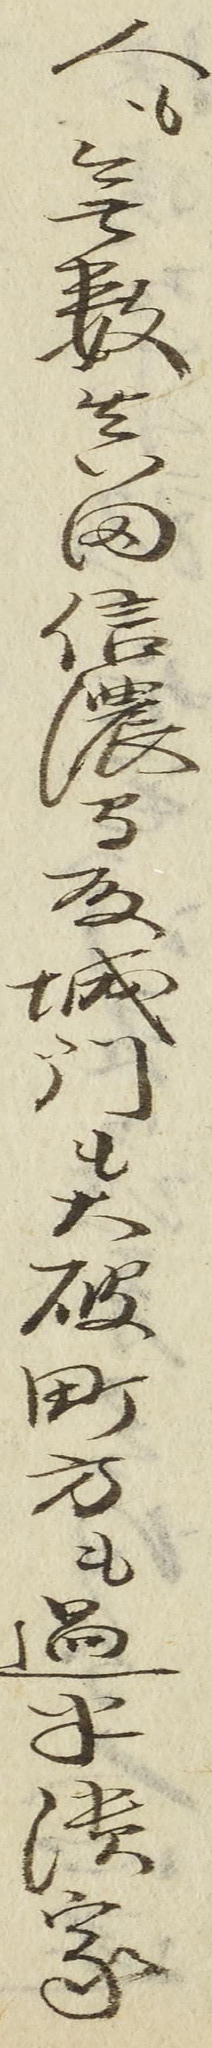人も無数真田信濃守殿城門も大破町方も過半潰家
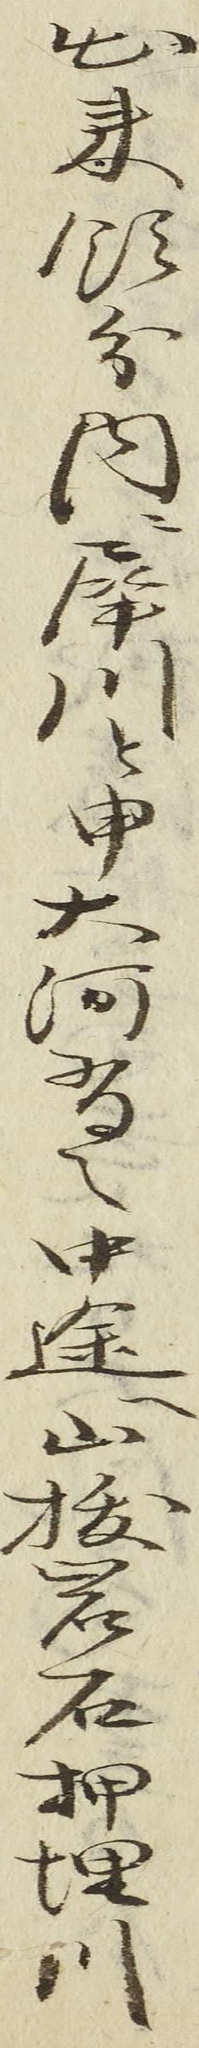出来領分内二犀川と申大河有之中途へ山抜け崩石押埋川
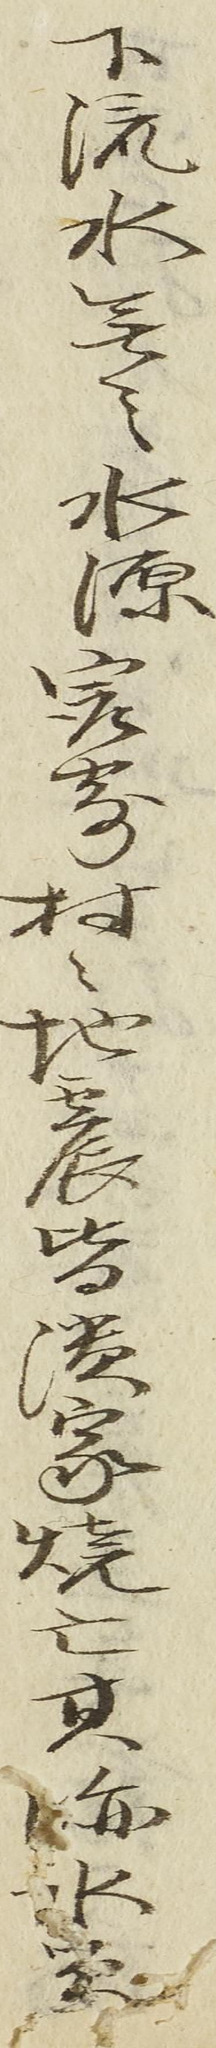下流水無之水源最寄村々地震皆潰家焼亡其跡水災
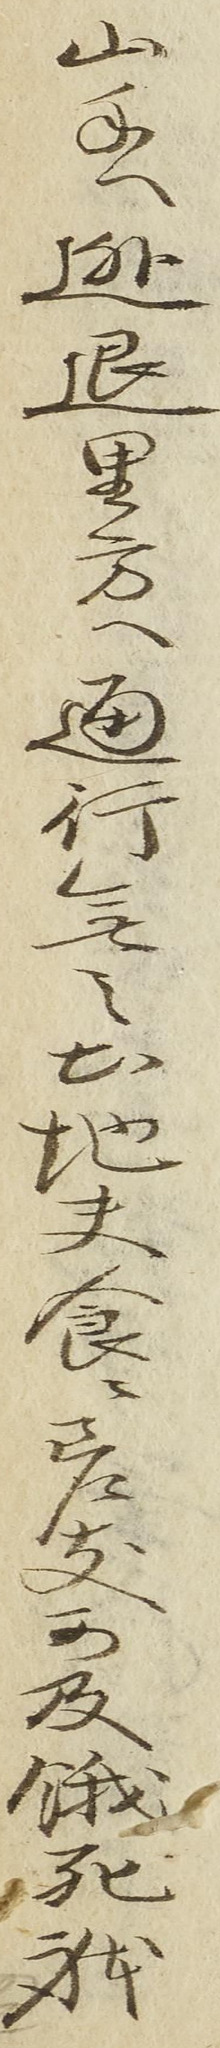山手へ逃退里方へ通行無之土地夫食二差支可及餓死体

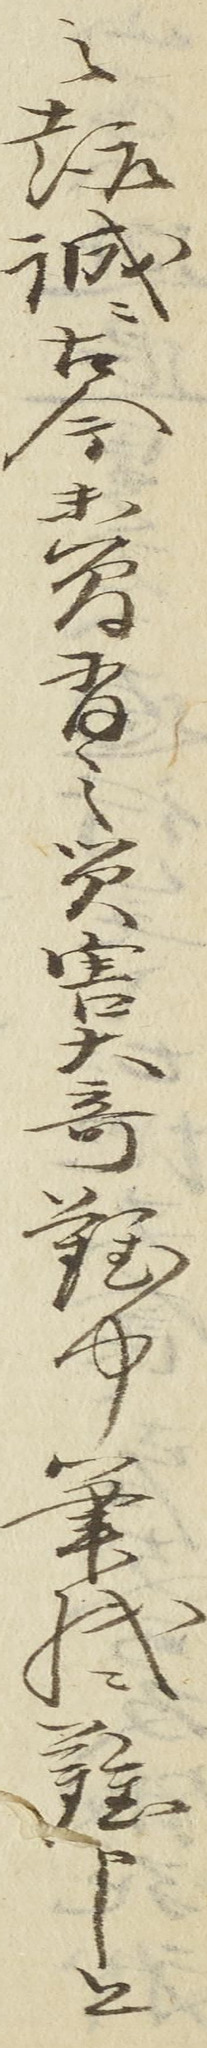之趣誠二古今未曾有之災害大奇難中筆紙二難申上
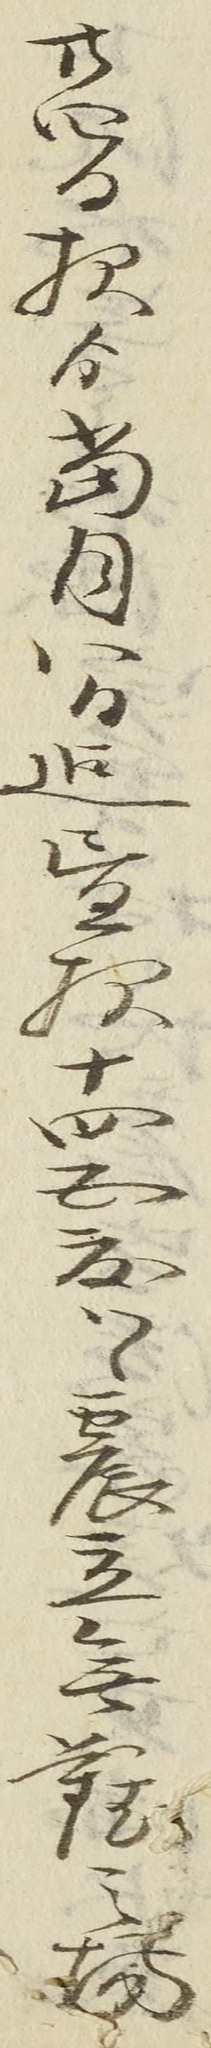廿四日夜ゟ当月八日迄昼夜十四五度ツゝ震立無難之場
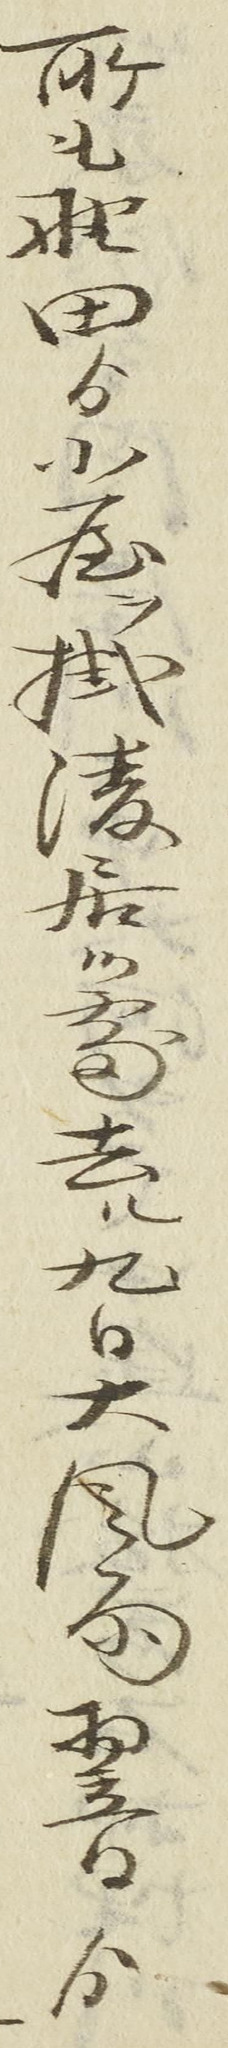所も野田ゟ小屋ヲ掛凌居候処去ㇽ九日大風雨翌日ゟ
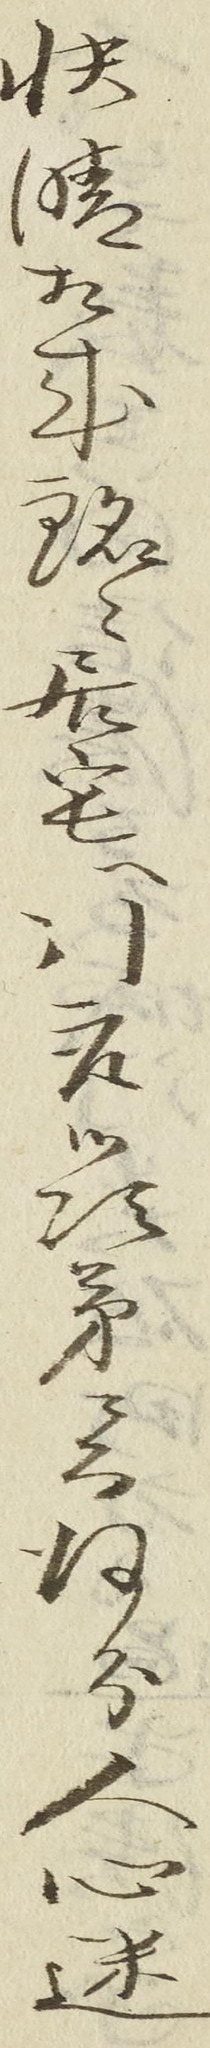快晴相成銘々居宅へ引取候次第二而何分人心迷
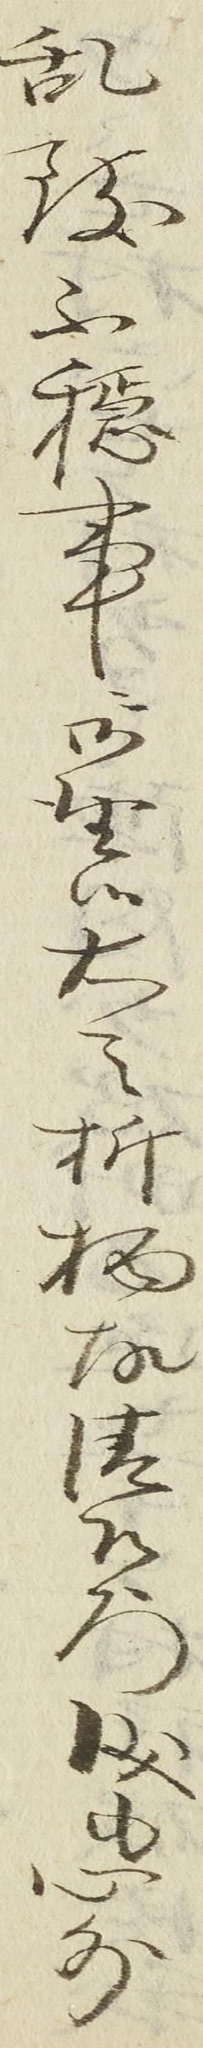乱致不穏事二御坐候右之折柄故清左衛門儀も心外
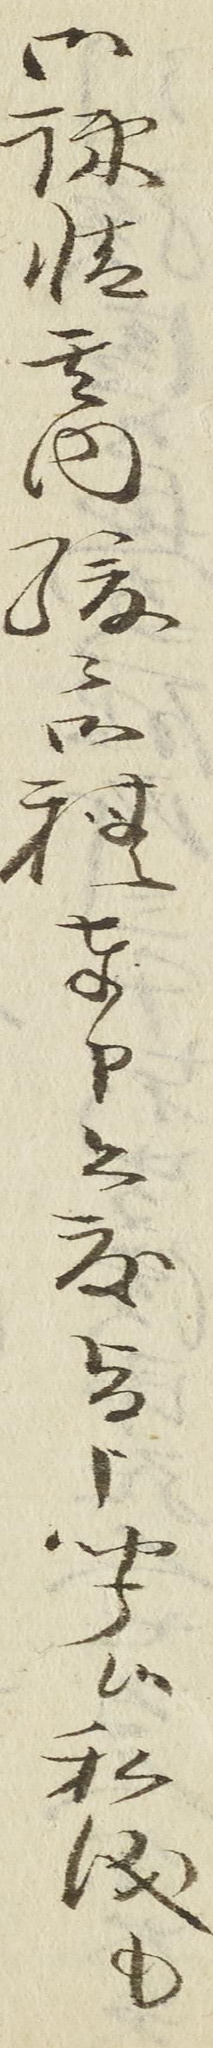御秋情其内緩々御礼奉申上度旨申聞候私儀も
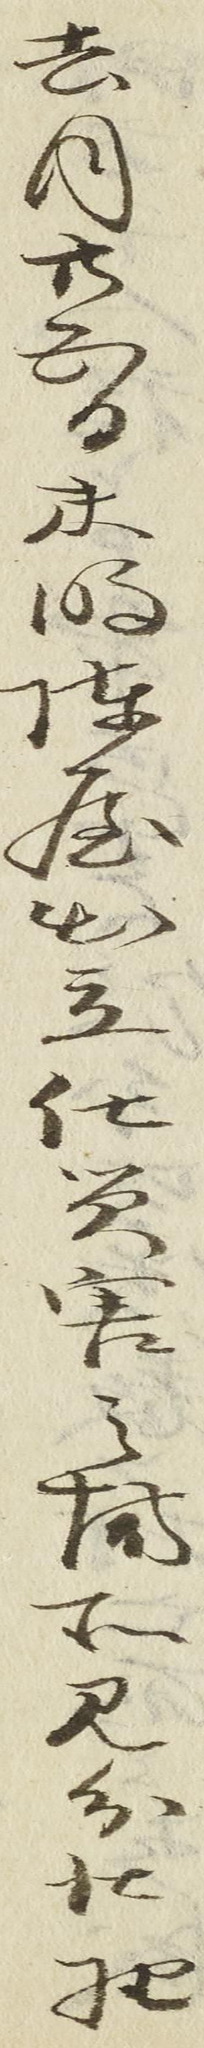去月廿六日未明陣屋出立仕災害之場所見分仕野
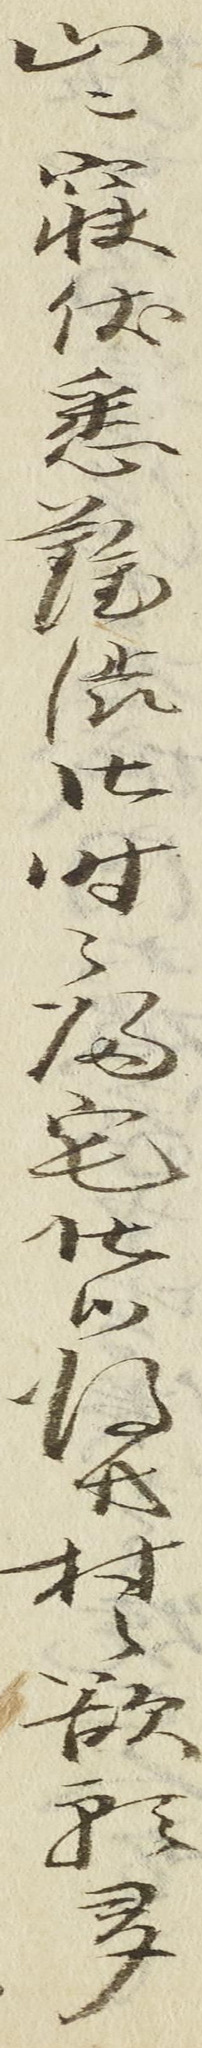山二寝伏悉難渋仕時々帰宅仕候得共村々歎願多
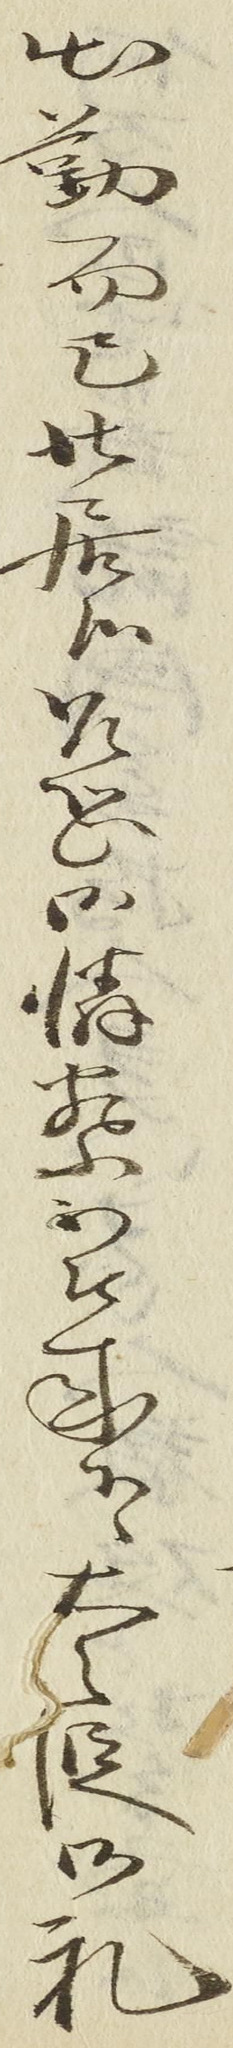出勤而巳罷居候乍恐御情察可被成下候右之段御礼
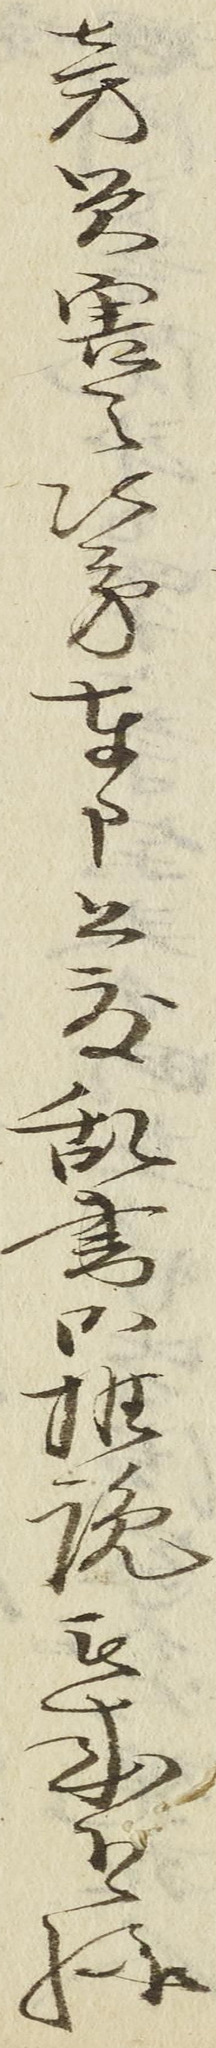旁災害之次第奉申上度乱書御推読被成下候様
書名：信濃國大地震記　乾
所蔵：東京大学地震研究所図書室 Earthquake Research Institute Library, The University of Tokyo, JAPAN
